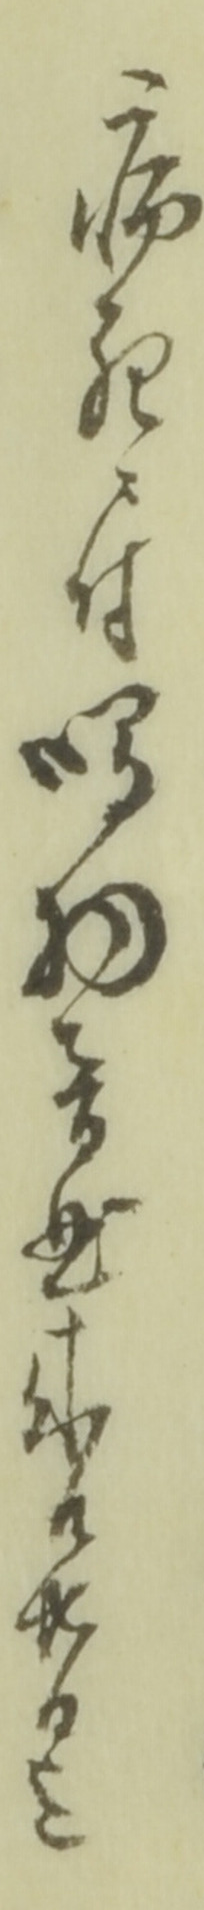病気二付鳴物音曲来ル廿日迄
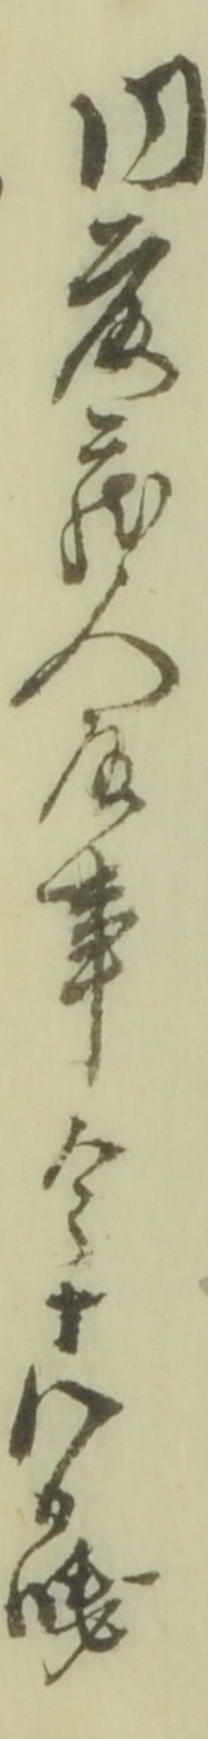内藤蔵人殿事今十八日暁
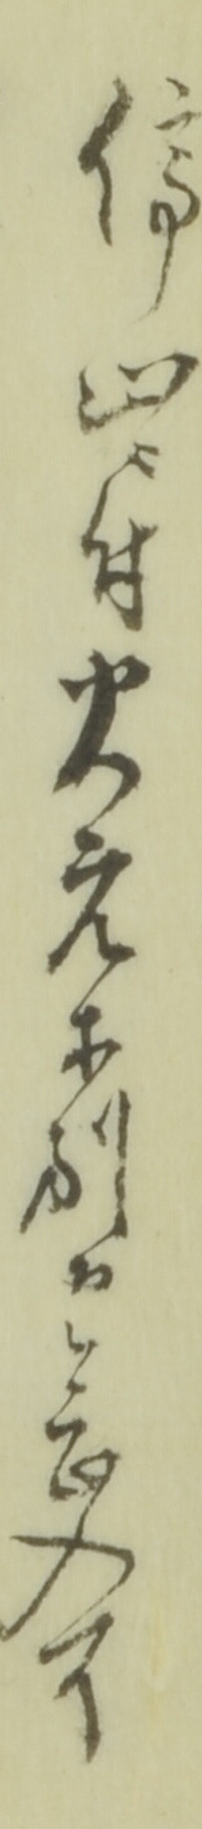停止二付火元など別而念入可
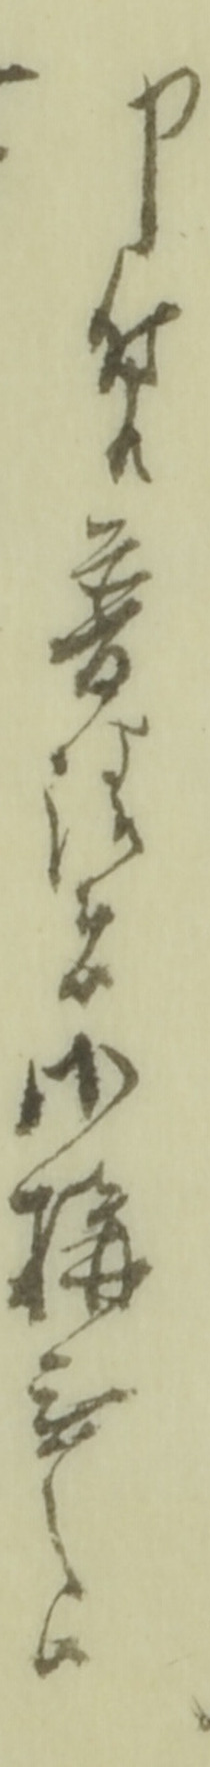申付候普請者御構無之候
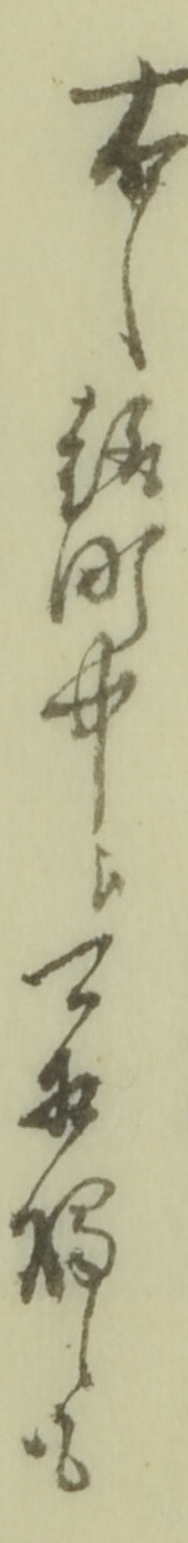右之趣町中え可相触候以上
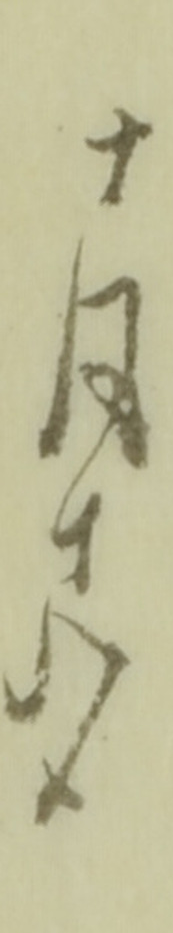十月十八日
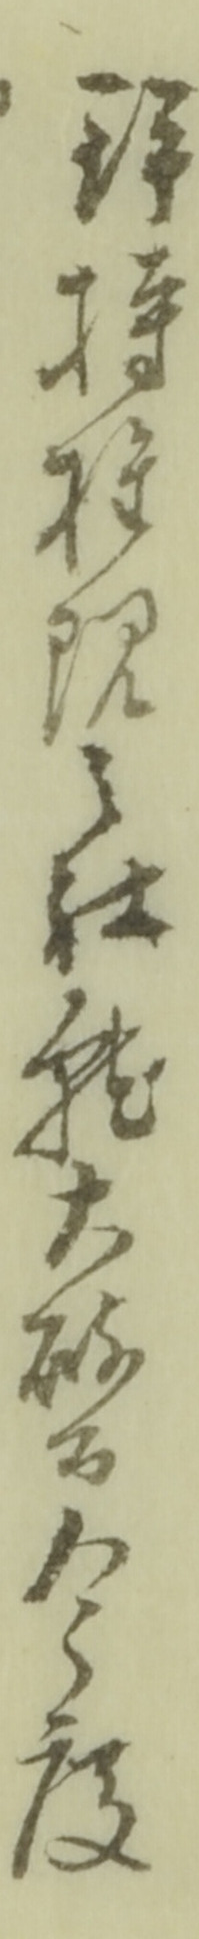拝持摧院之社就大破而今度
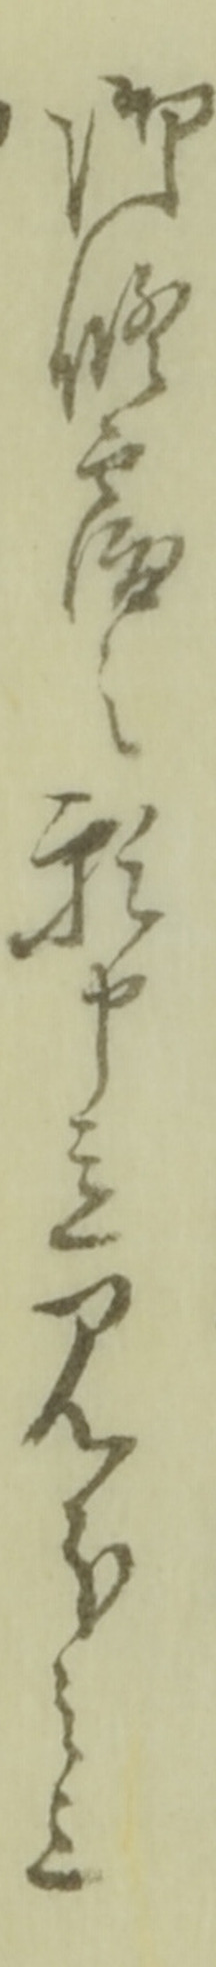御修覆之願申立見分之上
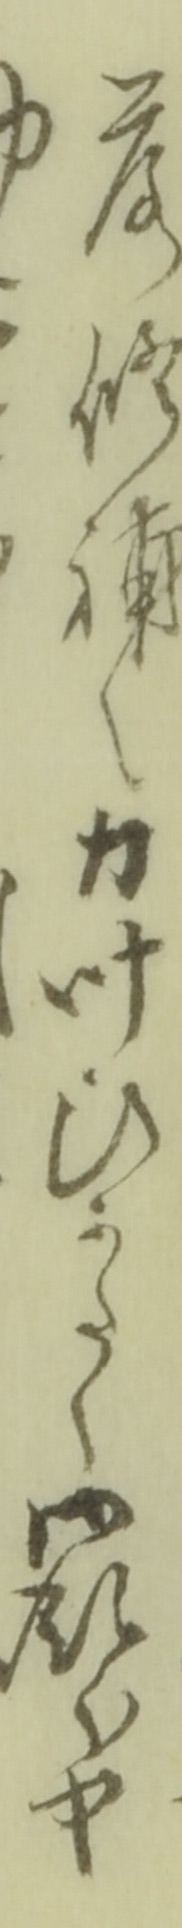厳修補之力叶ひ上たく御領分中
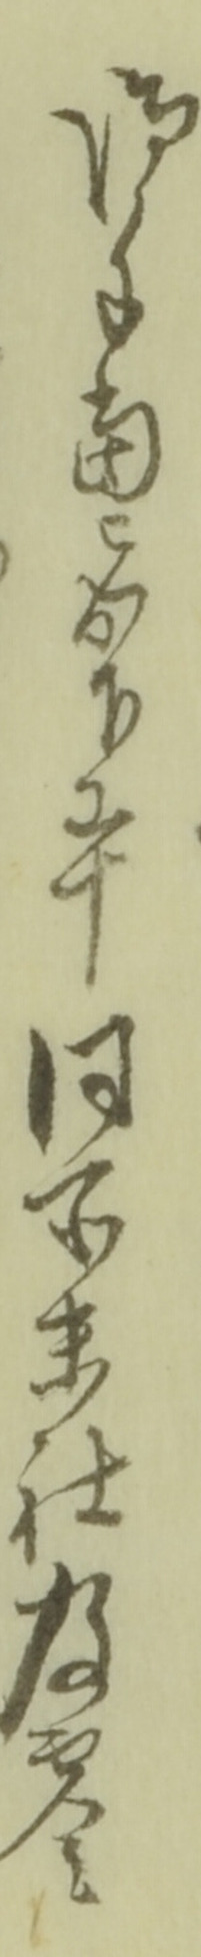御手当被成下畢竟同所末社及惣全
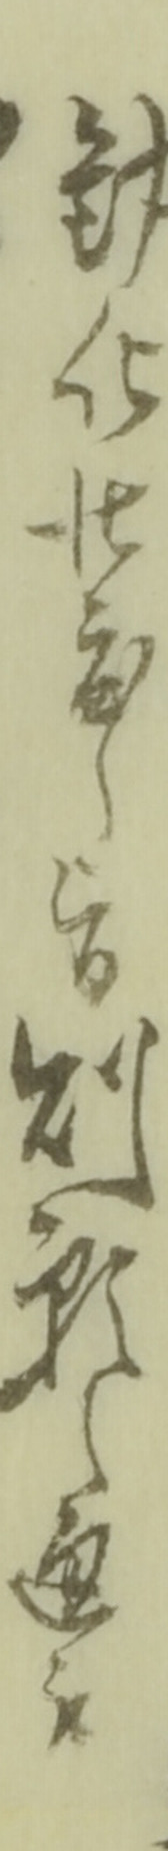勧化仕度候旨則願之通被
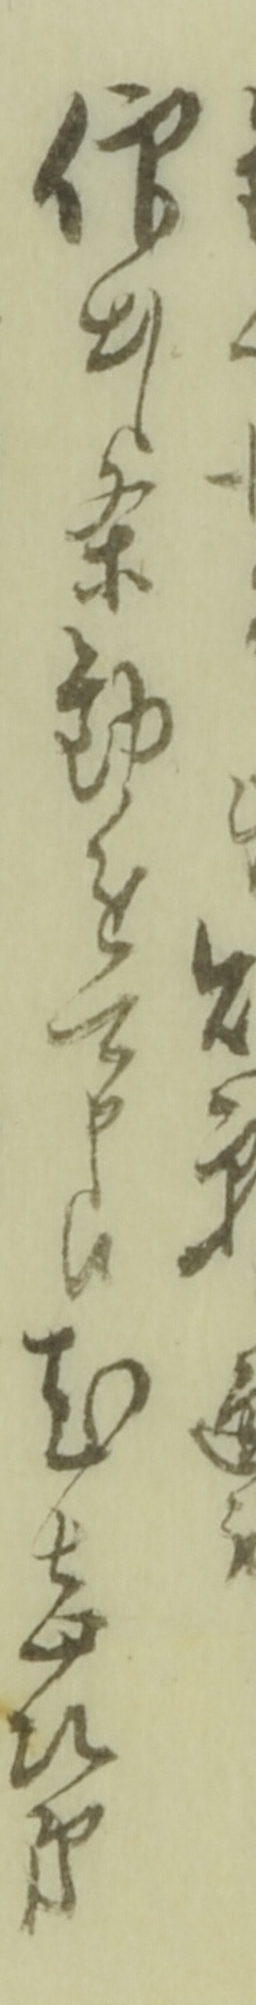仰出候条勧進可申候尤志次第
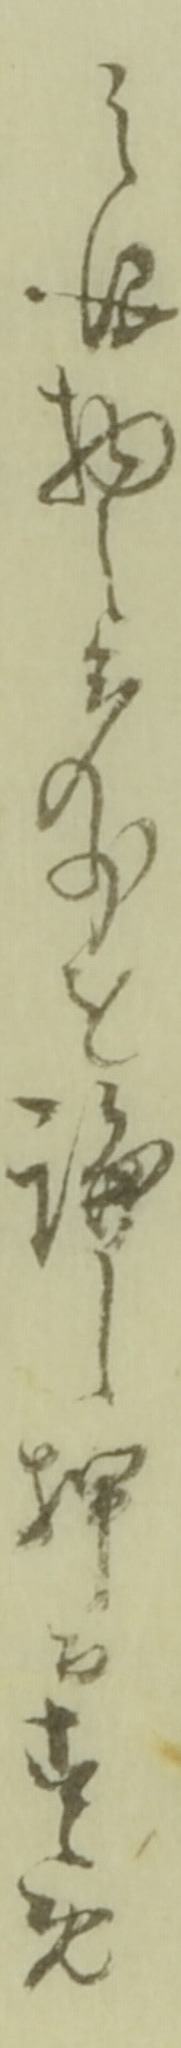候様物之多少を論し押而せめ
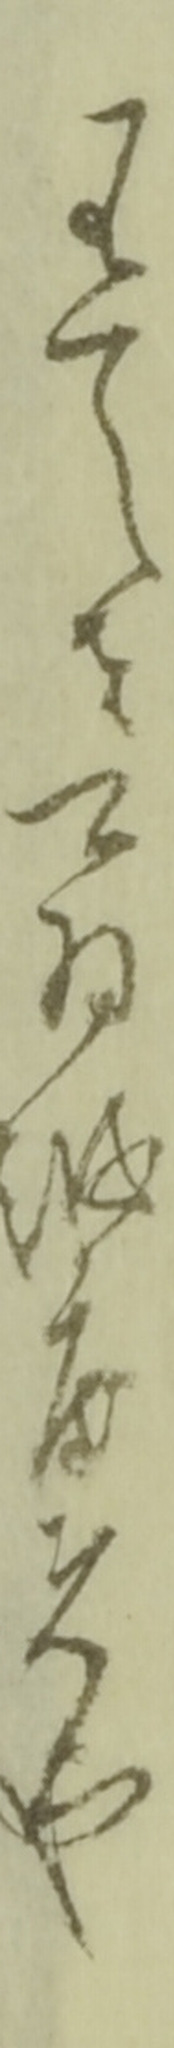有之者可為越度者也
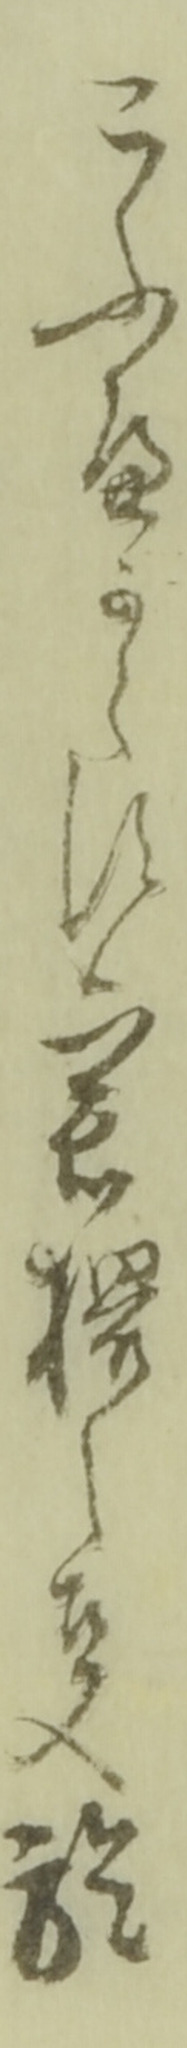こふへからす候若猥候事於
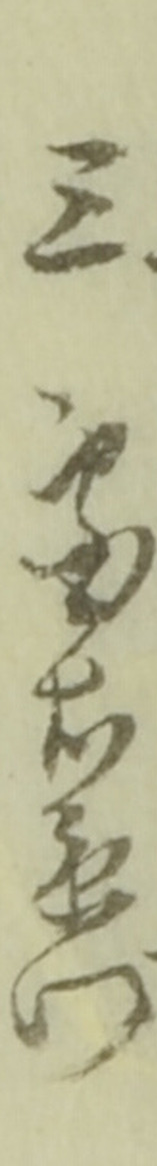三圓右衛門
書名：御公儀様御領主様御触書控
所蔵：伊那市立高遠町図書館・合同会社AMANE
